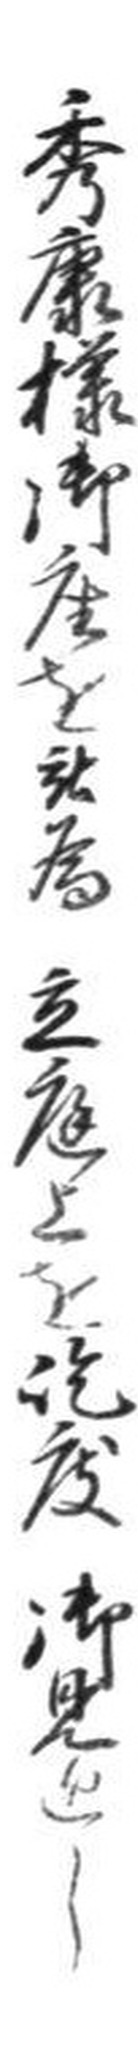秀康様御座を被為立庭上を屹度御見廻し
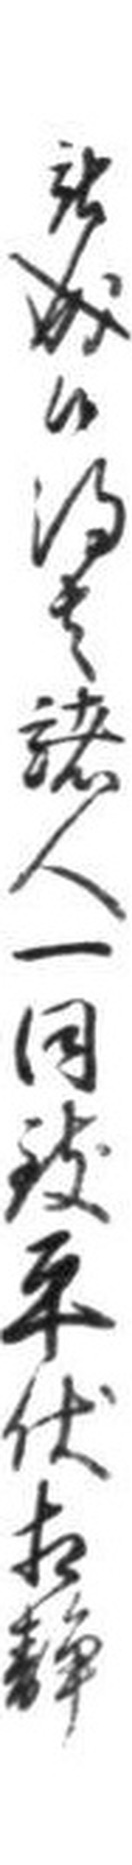被成候得者諸人一同致平伏相静
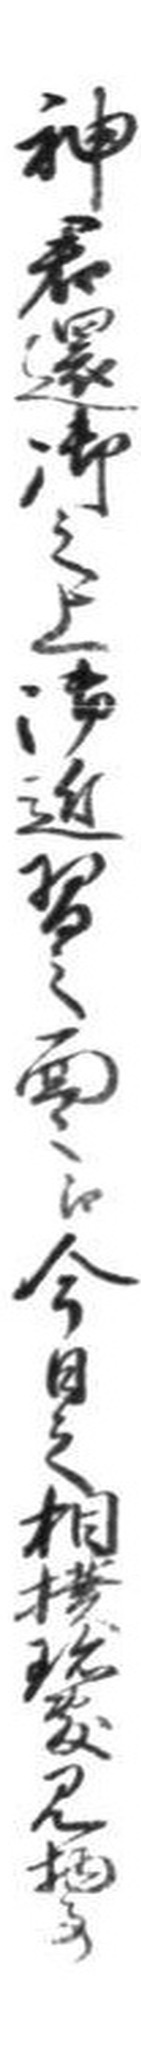神君還御之上御近習之面々江今日之相撲珍敷見物事
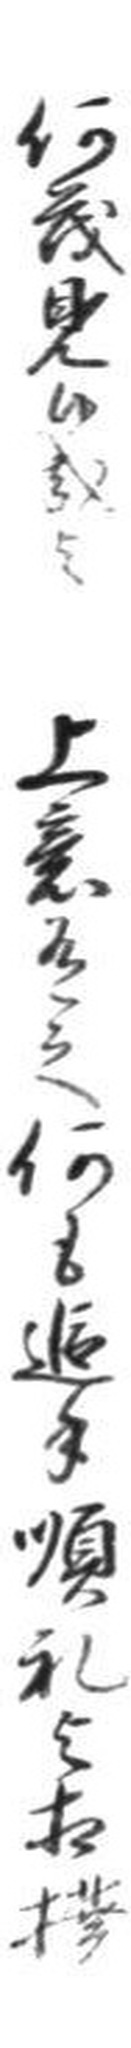何も見候哉と上意有之何も追手順礼と相撲
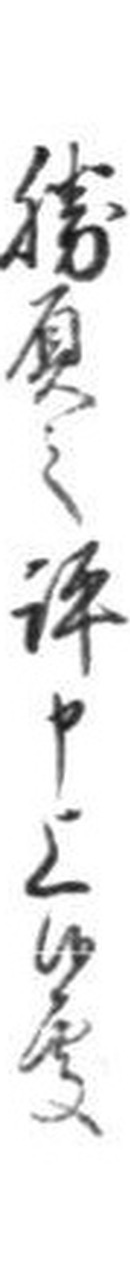勝負之評申上候処
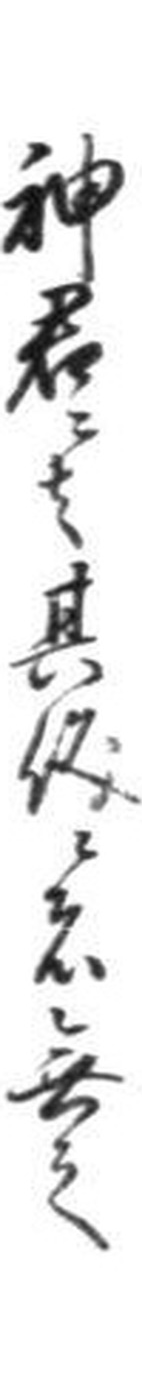神君ニ者其儀ニ者無之
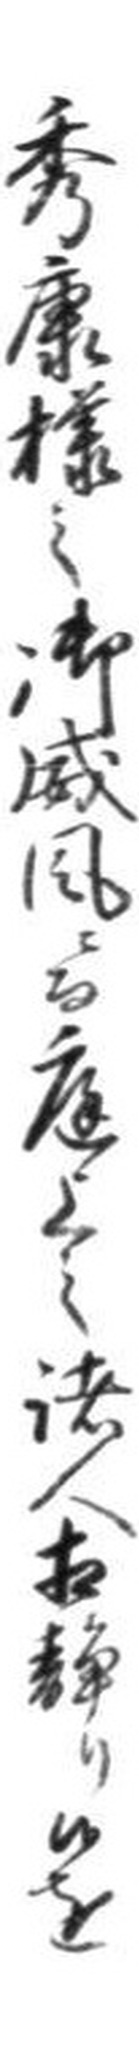秀康様之御威風ニ而庭上之諸人相静り候を
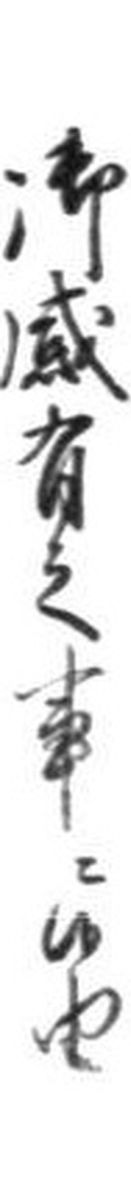御感有之事ニ候由
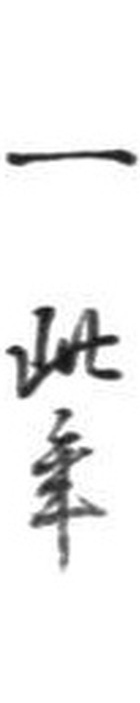一此年
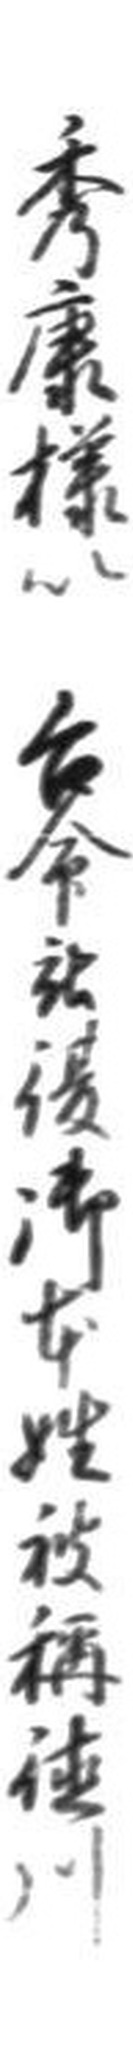秀康様以台命被復御本姓被称徳川

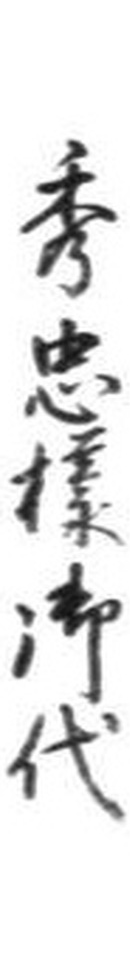秀忠様御代
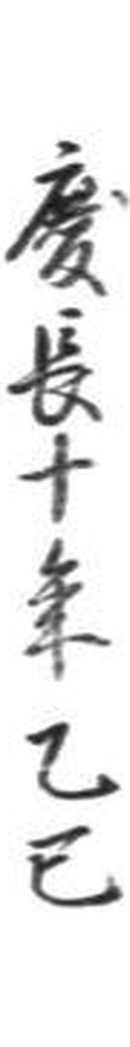慶長十年乙巳
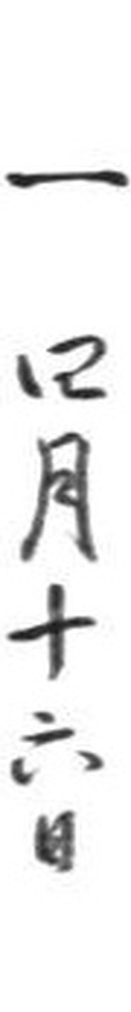一四月十六日
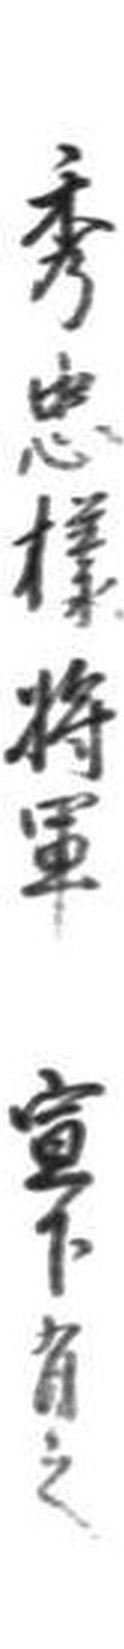秀忠様将軍宣下有之
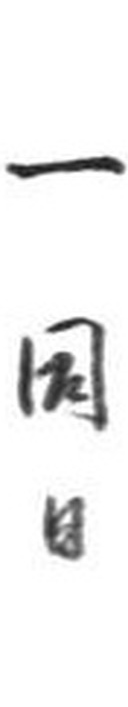一同日
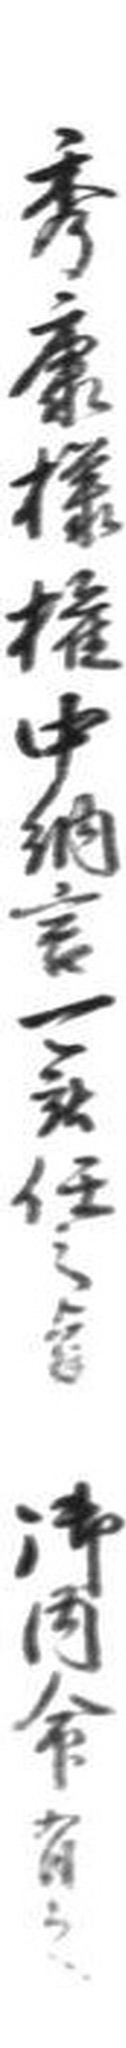秀康様権中納言可被任之旨御内命有之
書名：家譜 一 秀康公 従天正二年到慶長十二年
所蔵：福井県文書館 Fukui Prefectural Archives
